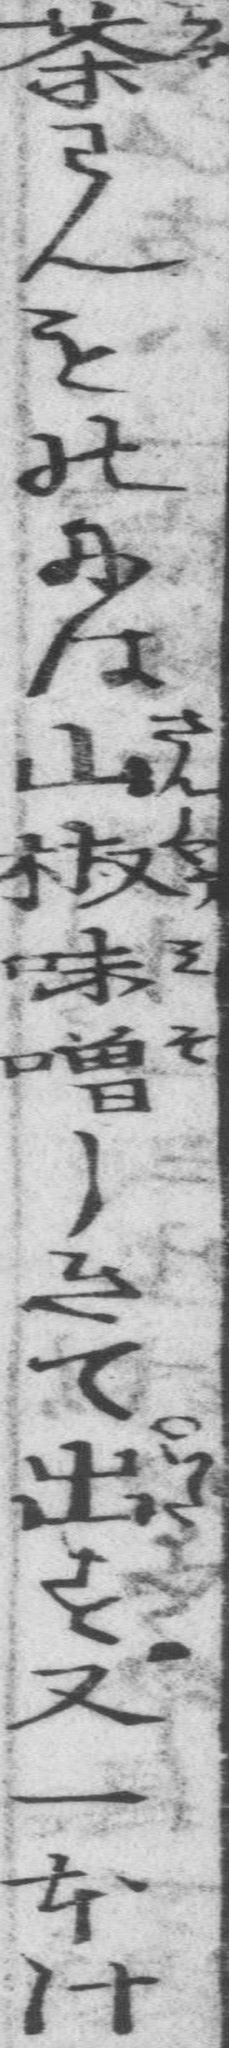茶わんものには山椒味噌しきて。出す。又一本汁
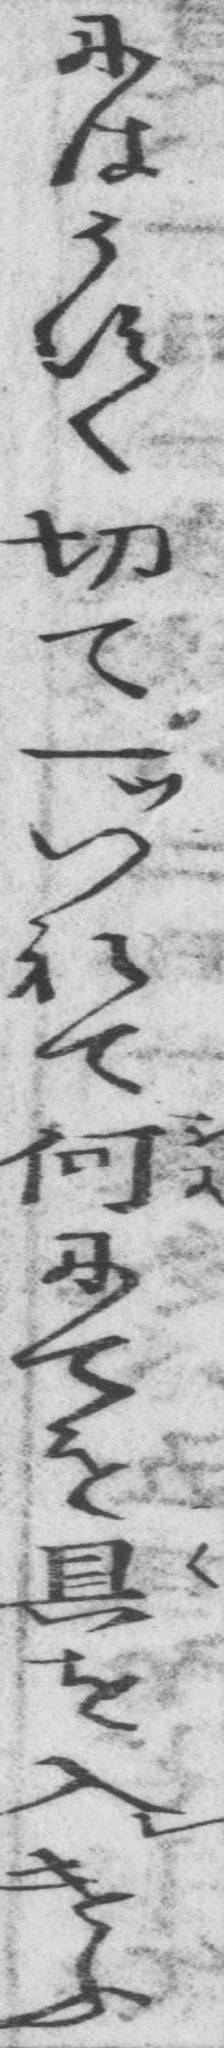にはうすく切て。一ツいれて何にても具を入れ遣ふ
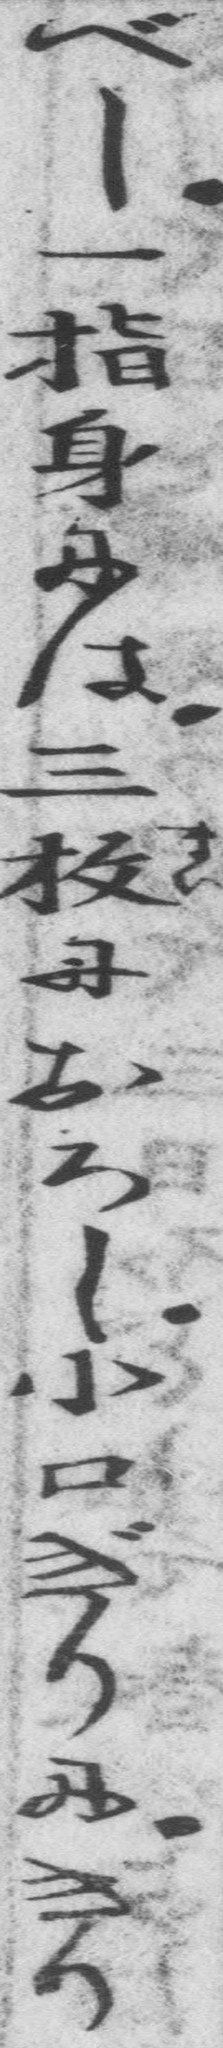べし。一指身には。三枚におろし。小口ぎりに。きり
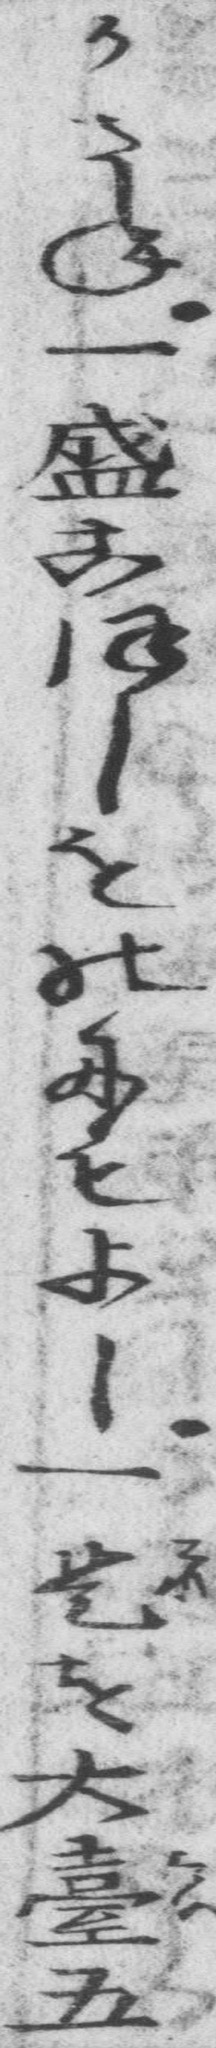かさね。一盛こほしものにもよし。一是を大台五
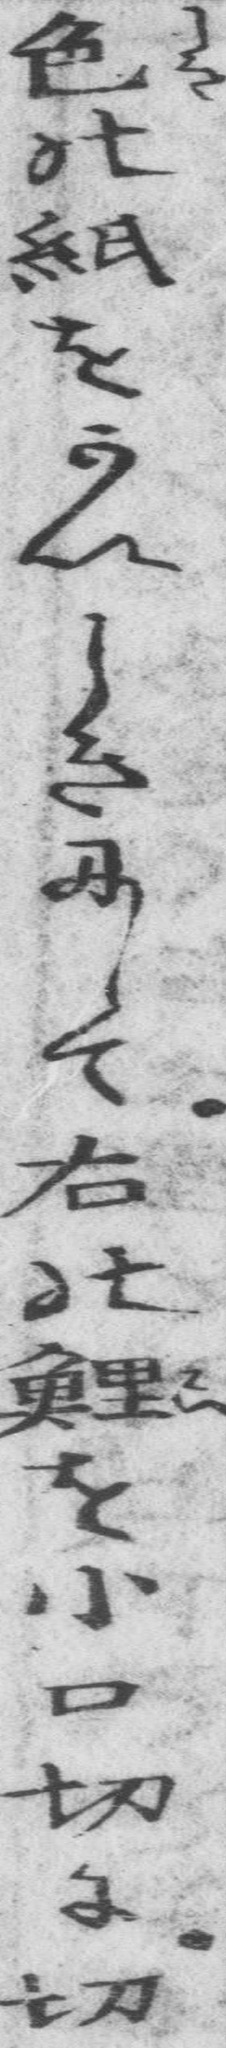色の紙をかいしきにして。右の鯉を小口切に。切
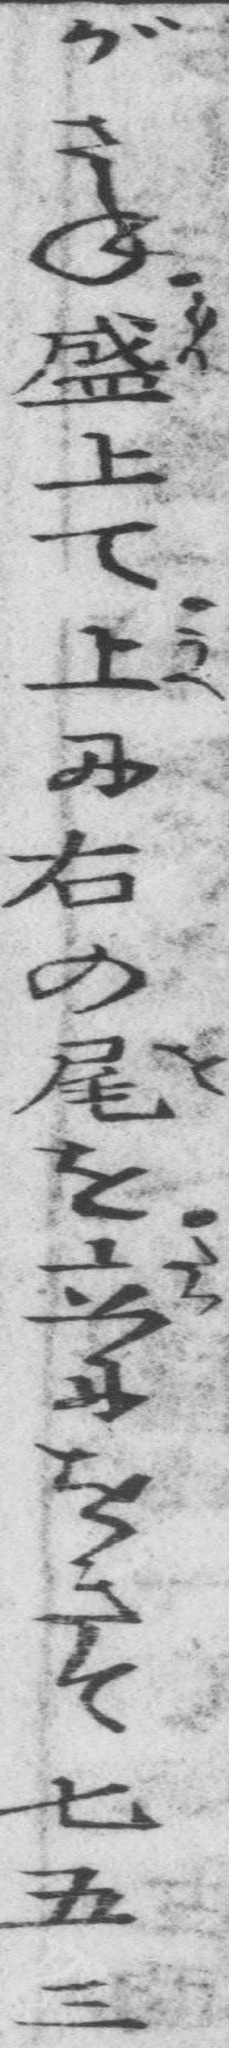がさね。盛上て。上に右の尾を。立にをきて七五三
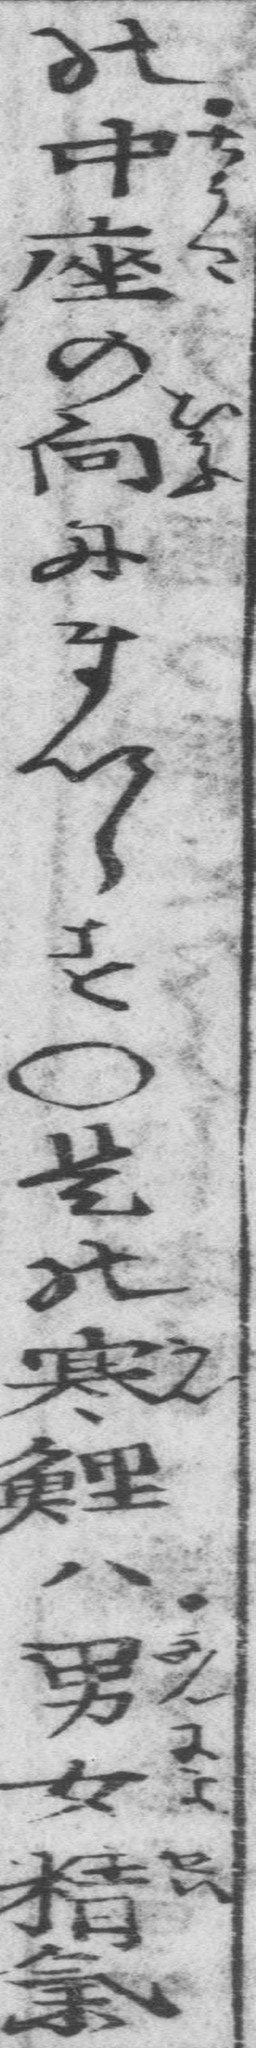の。中座の向にまいらす○是の寒鯉は。男女精気
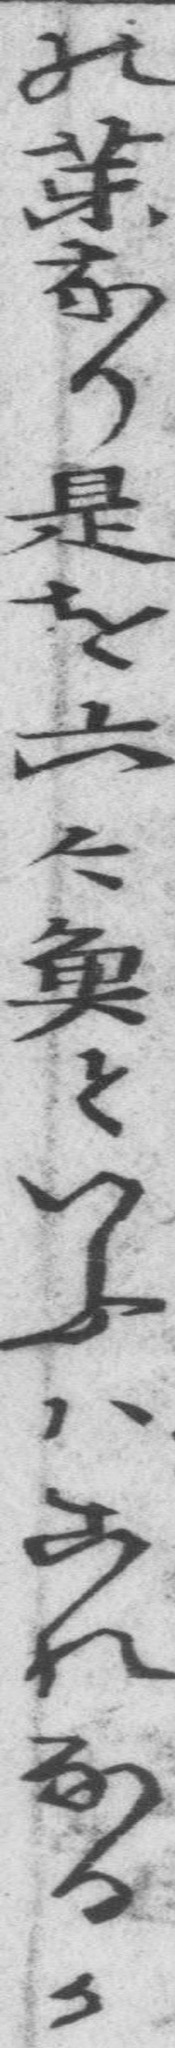の薬なり。是を六々魚といふは。これなるか
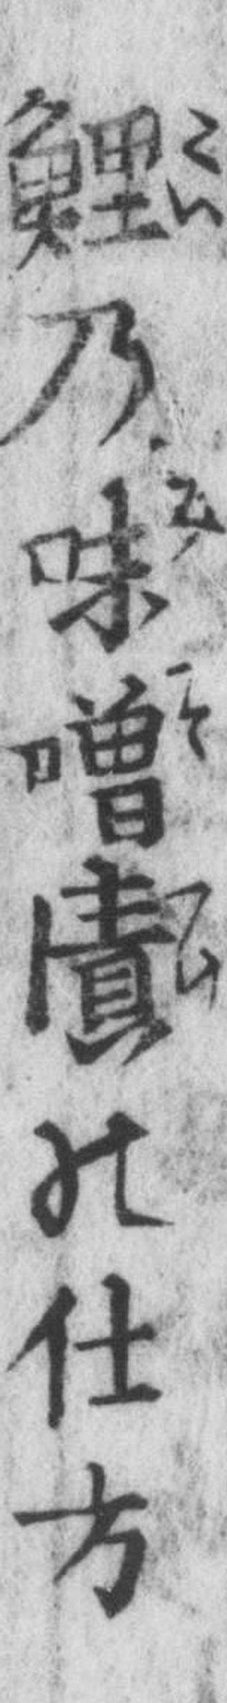鯉の味噌漬の仕方

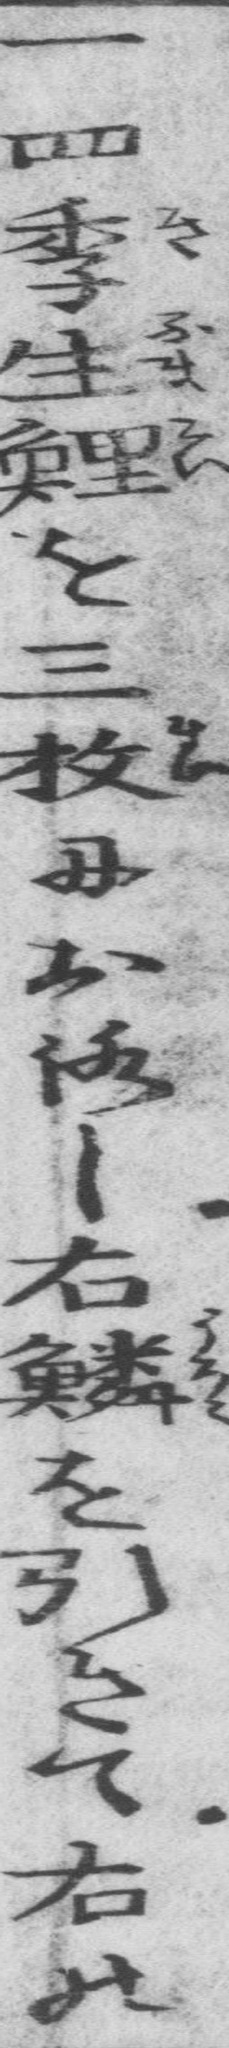一四季生鯉を三枚におろし。右鱗を引きて。右の
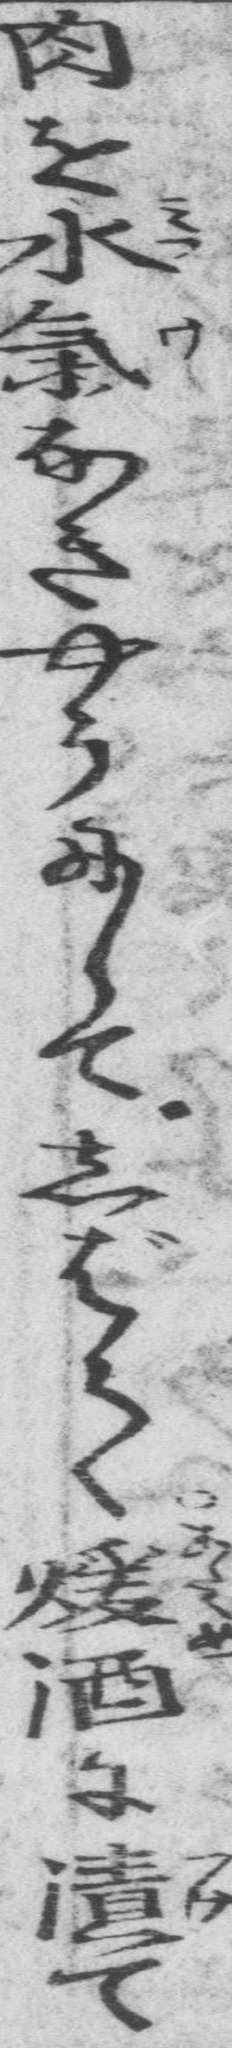肉を水気なきやうにして。しばらく。煖酒に漬て
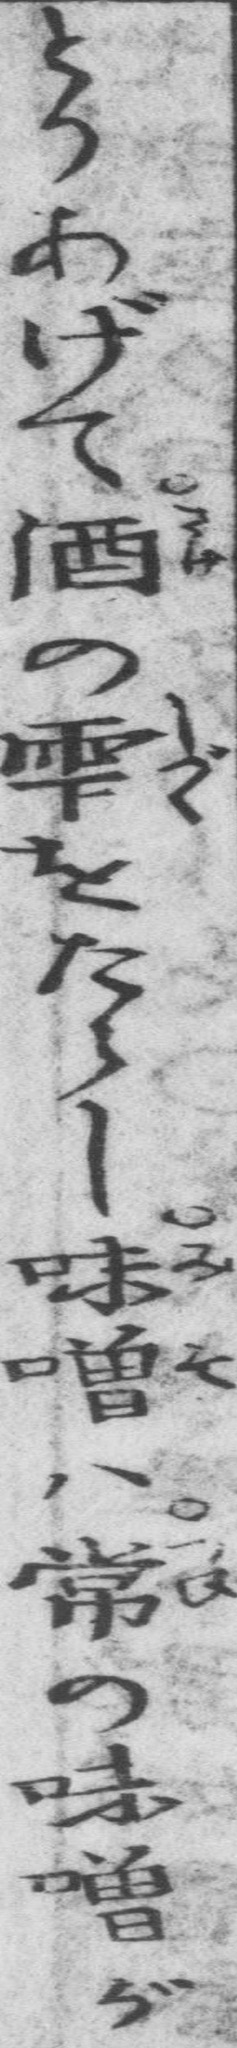とりあげて。酒の雫をたらし。味噌は。常の味噌が
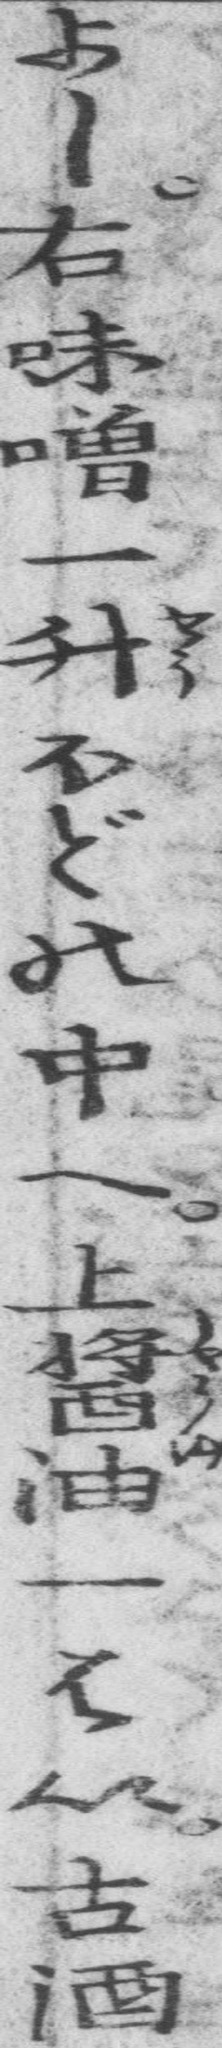よし。右味噌一升ほどの中へ。上醤油一はい。古酒
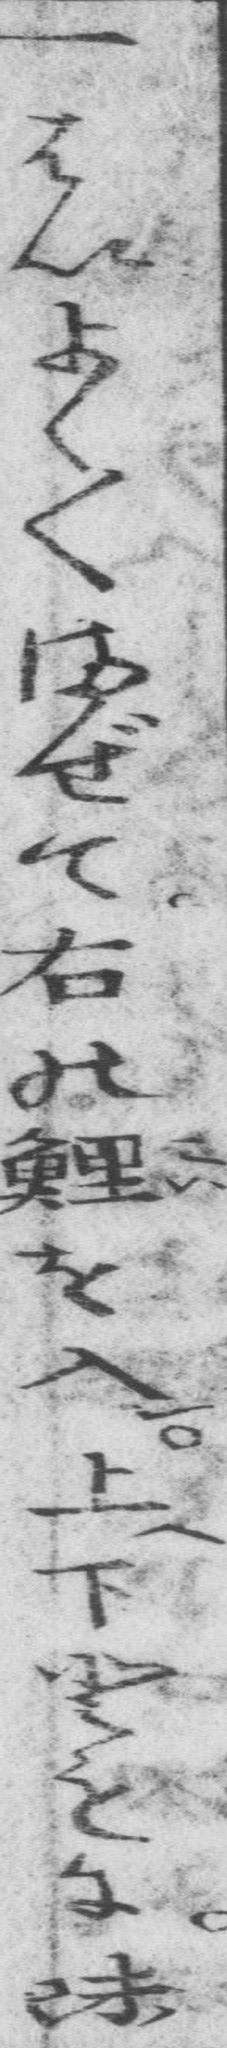一はいよく〳〵まぜて。右の鯉を入れ。上へ下ともに。味
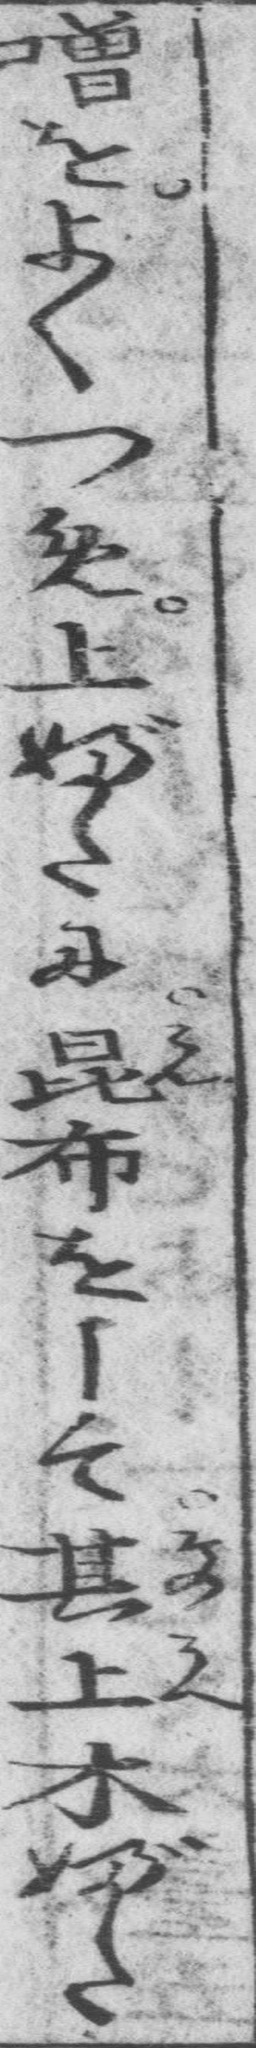噌を。よくつめ。上ぶたに。昆布をして。其上木ぶた
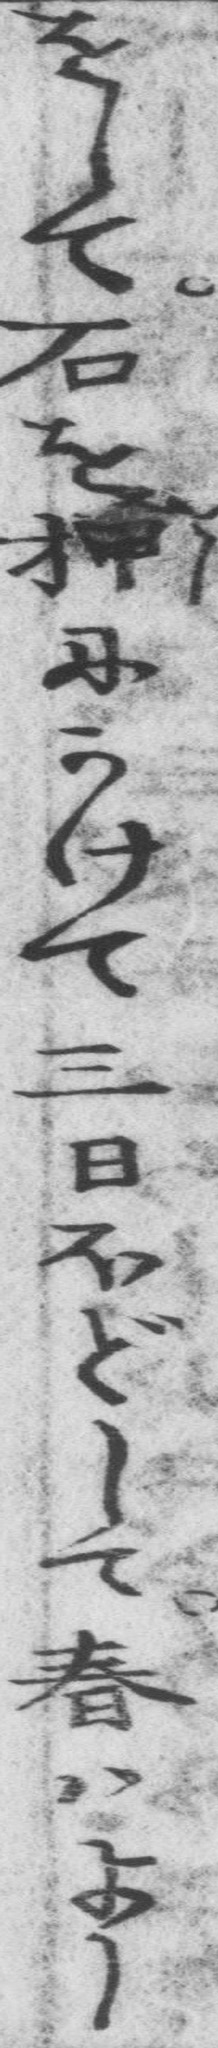をして。石を押にかけて三日ほどして。春はよし
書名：萬寳料理秘密箱
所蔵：大阪府立大学学術情報センター 国文学研究資料館
